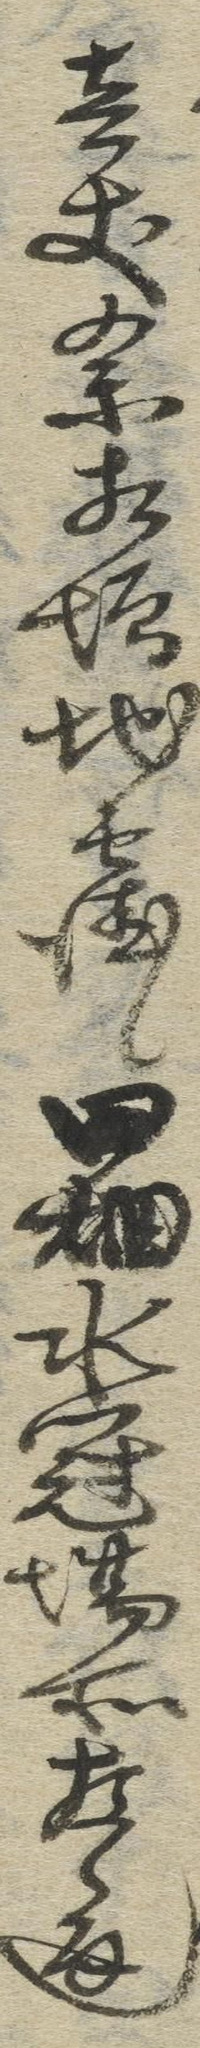壱丈余相増地窪候田畑水冠場所左之通
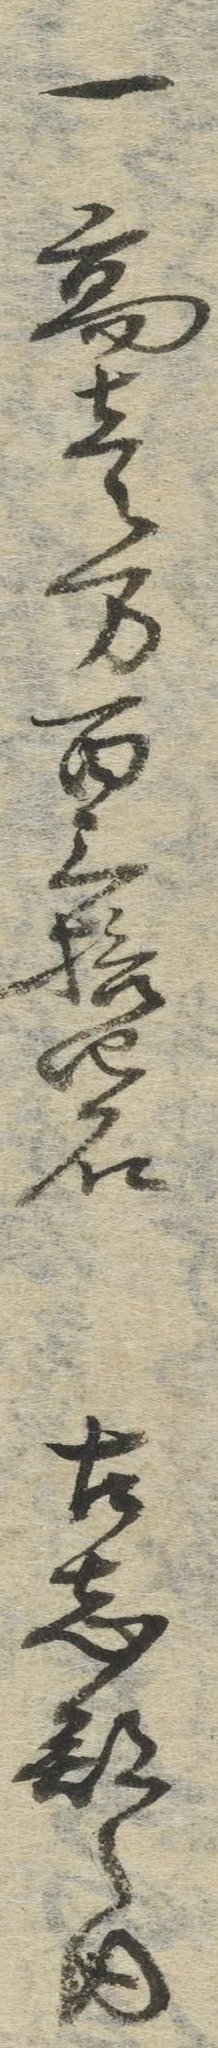一高壱万百三拾四石古志郡之内
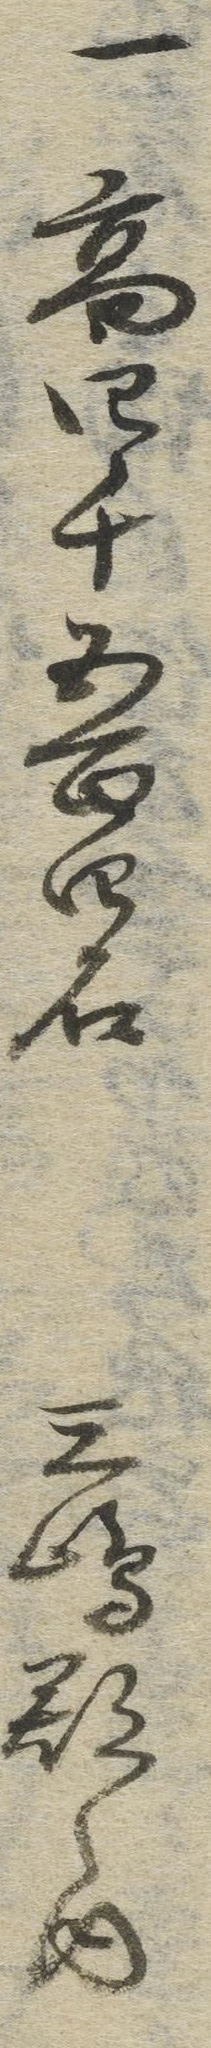一高四千五百四石三嶋郡之内
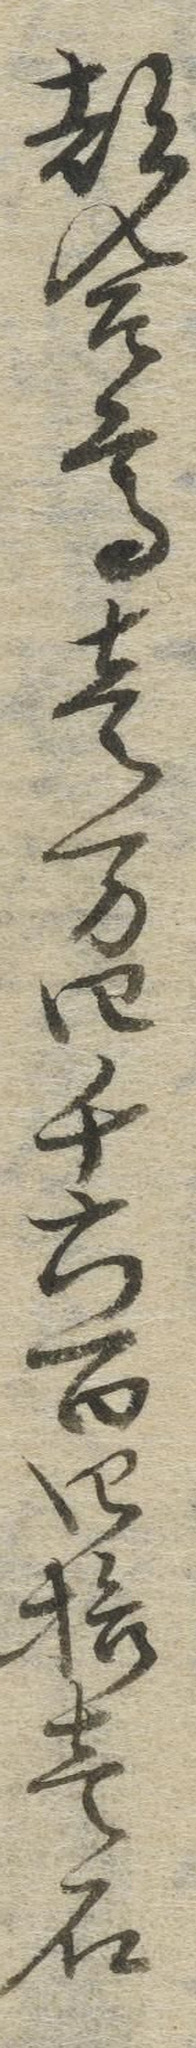都合高壱万四千六百四拾壱石
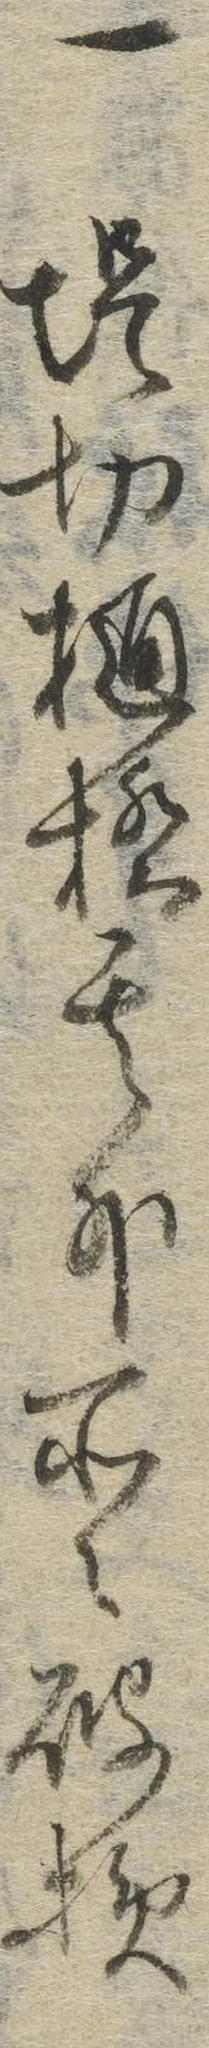一堤切樋橋其外所々破損
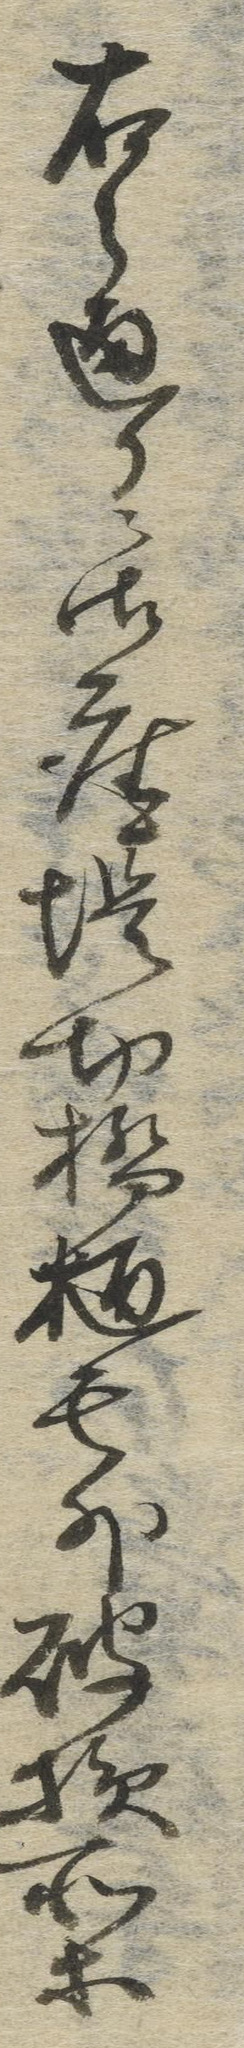右之通りニ御座候堤切橋樋其外破損所等
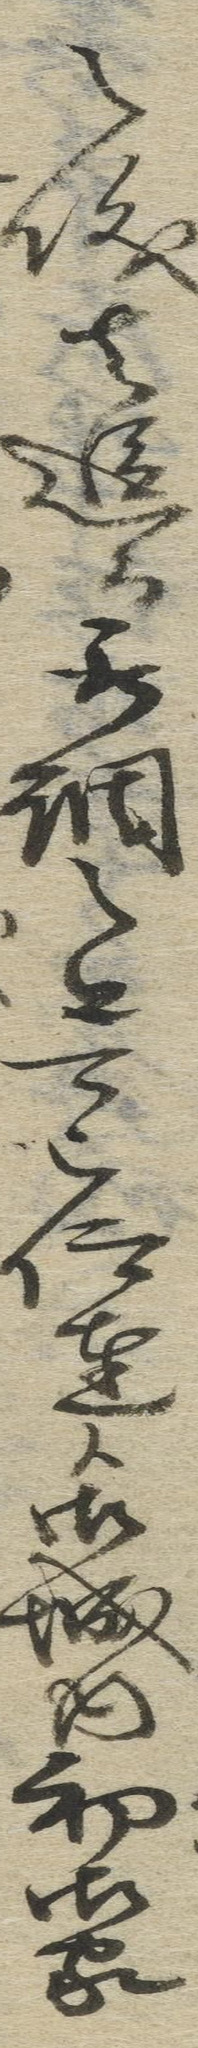之儀は追而取調之上可被仰達候御城内初御家
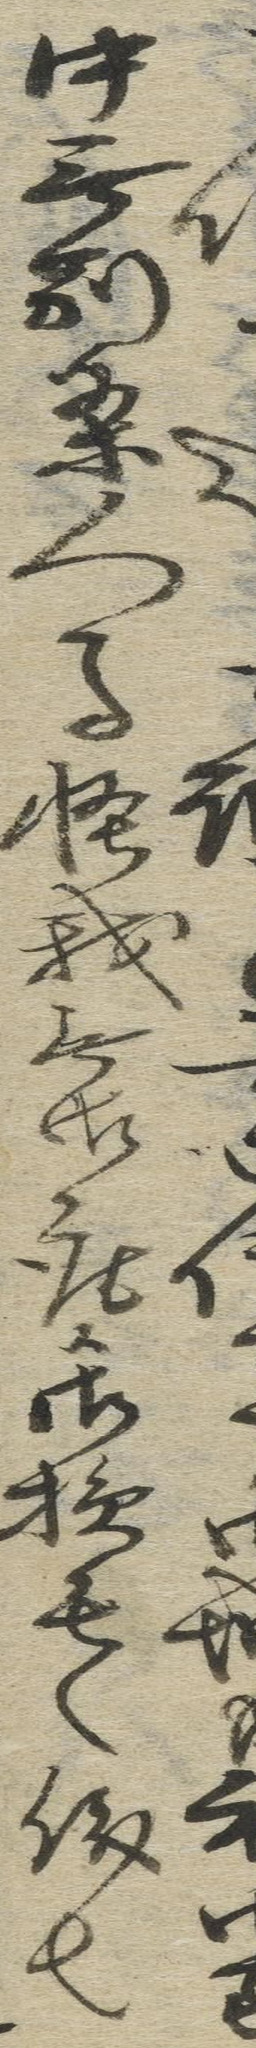中無別条人馬怪我無御座候御損毛之儀者
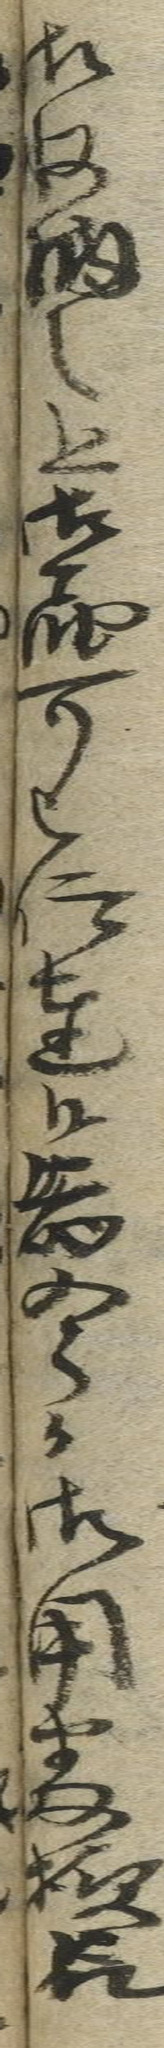御取調之上御届可被仰達候旨今日御用番様迄
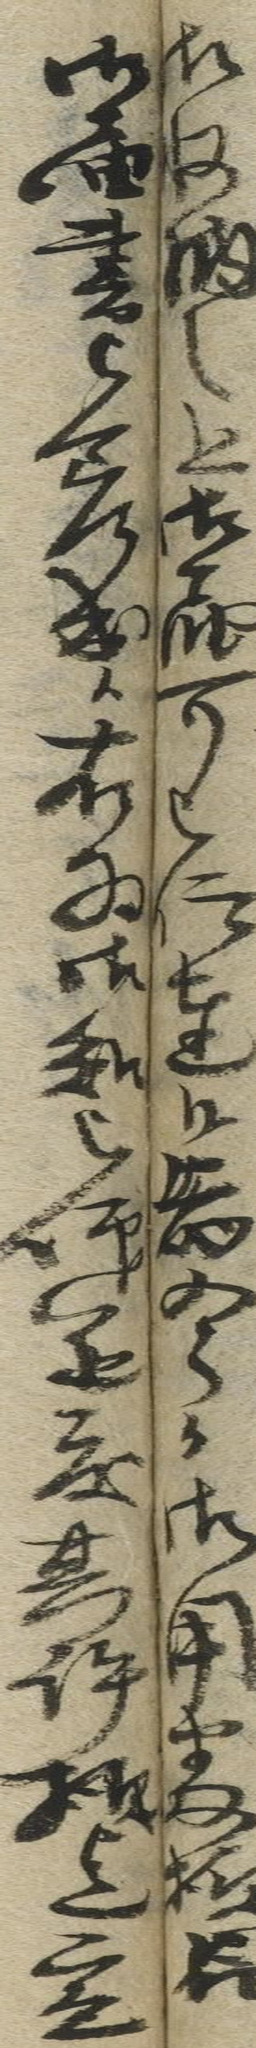御届書被差出候右為御知被仰進度其許様迄宜
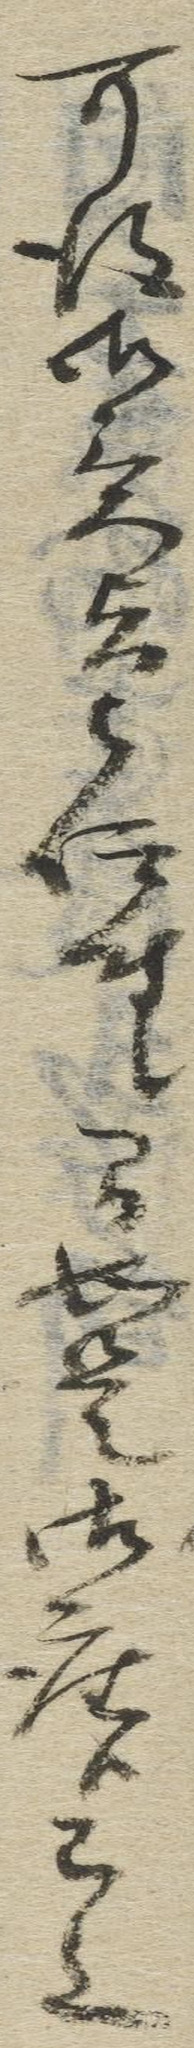可得御意旨被仰付候間如是御座候已上
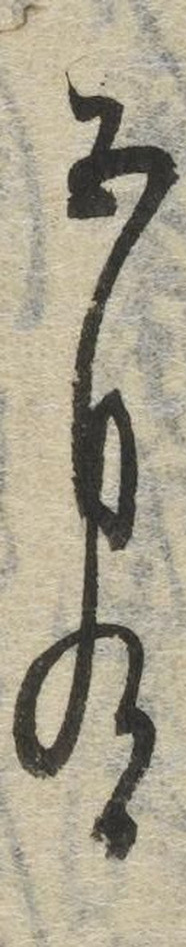五月九日
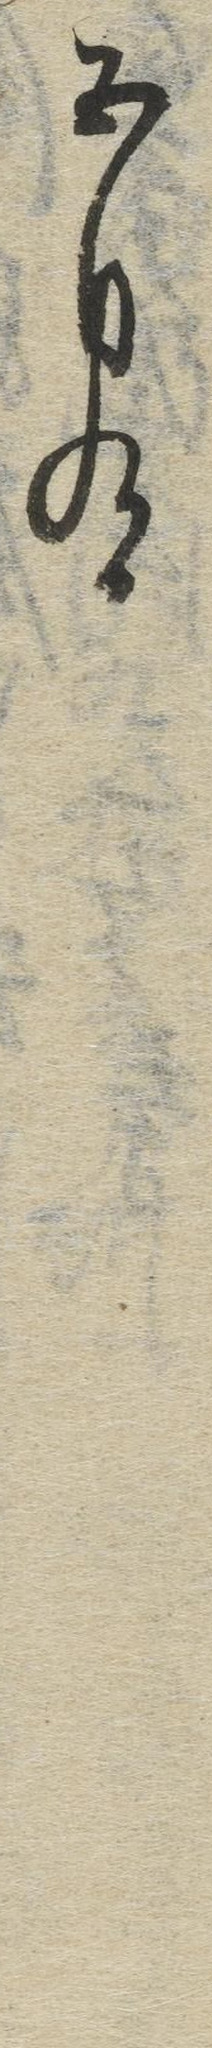五月九日
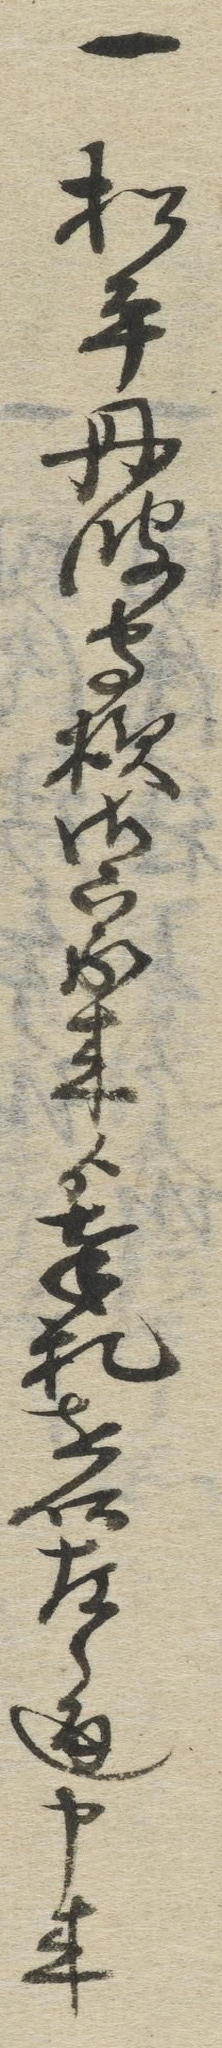一松平丹波守様御家来ゟ奉札を以左之通申来
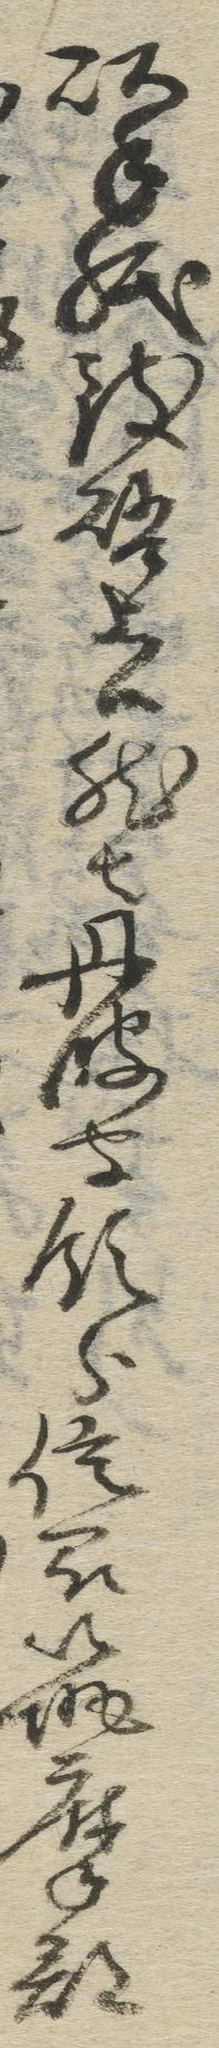以手紙致啓上候然者丹波守領分信州筑摩郡
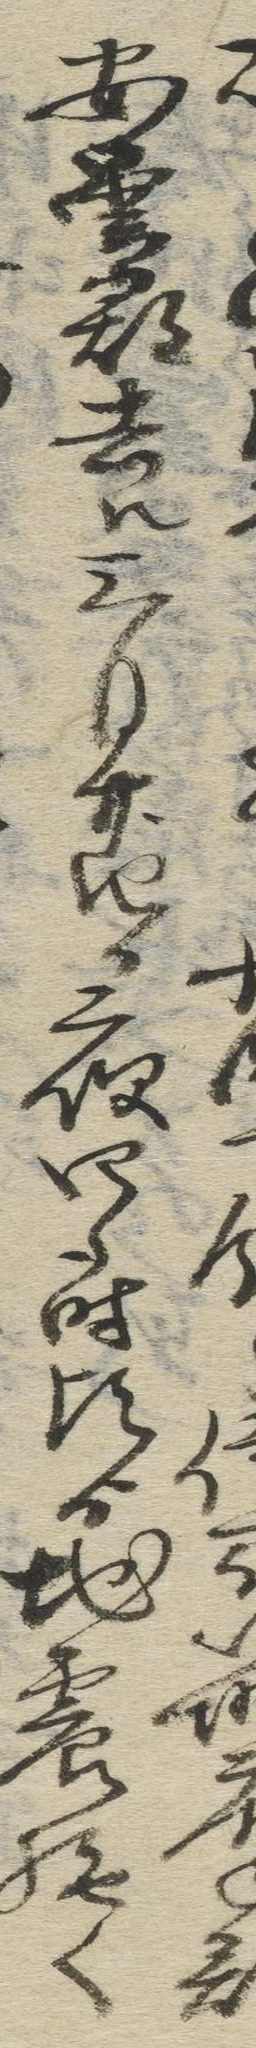安曇郡去ル三月廿四日夜四ツ時頃ゟ地震強く
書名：信濃越後　地震書留
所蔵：東京大学地震研究所図書室 Earthquake Research Institute Library, The University of Tokyo, JAPAN
